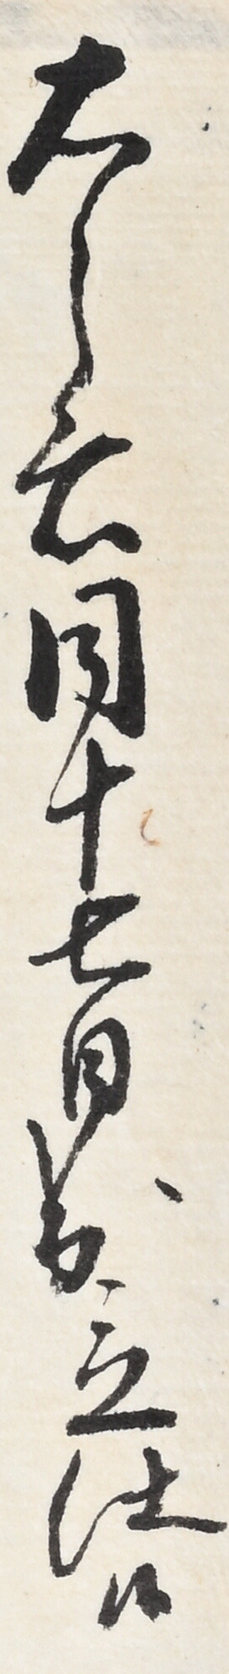右之者同十七日出立仕候
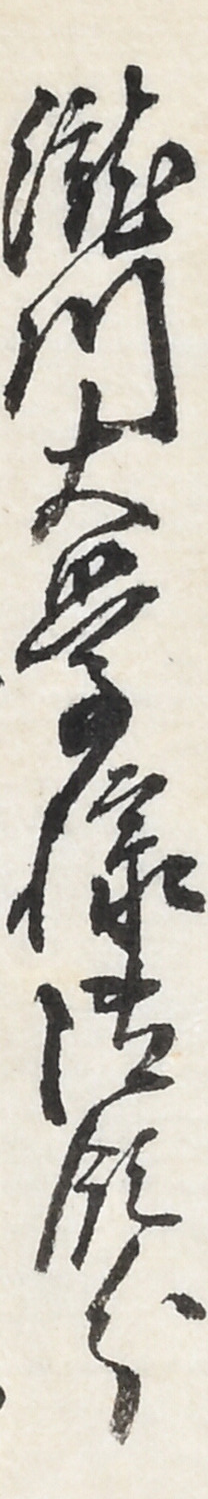瀧川大学様御領分
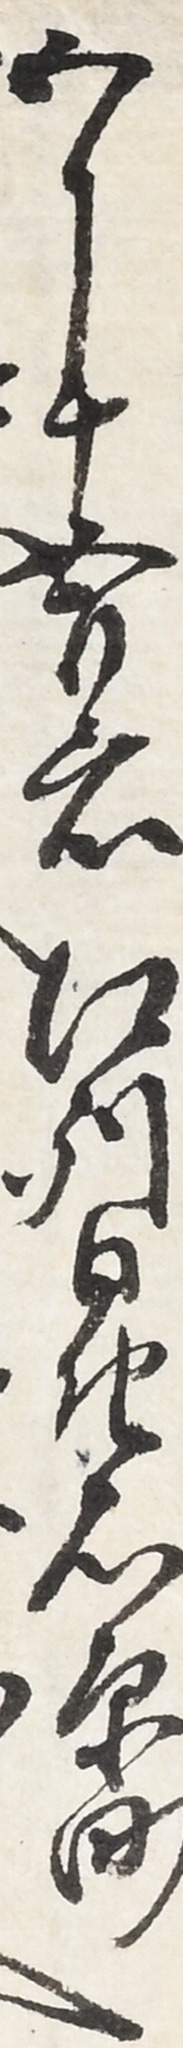五月十五日着江州日野石原町
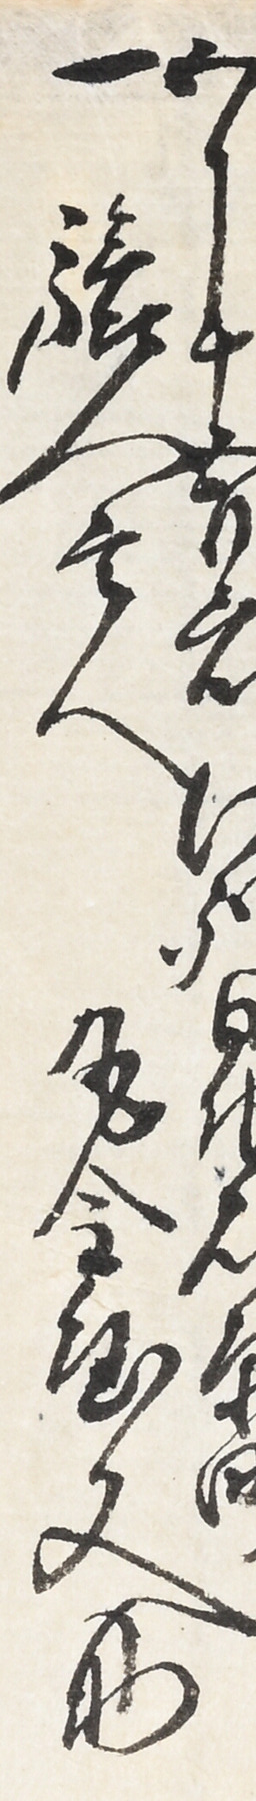一旅人壱人丸金屋又助
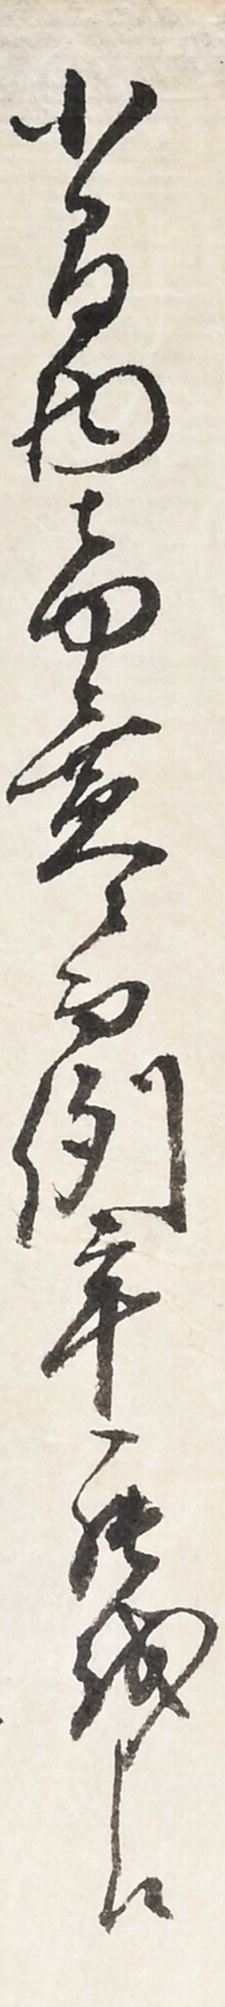小間物商売ニ而例年罷越申候
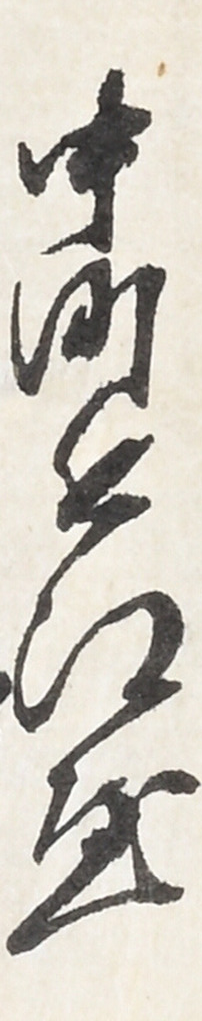中町近江屋
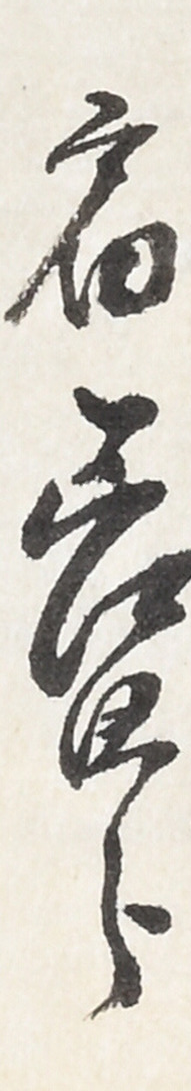宿善四郎
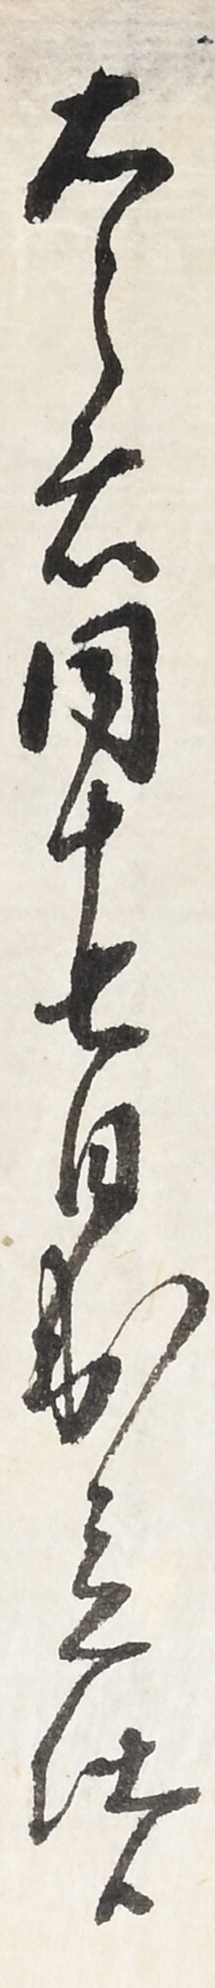右之者同十七日出立仕候
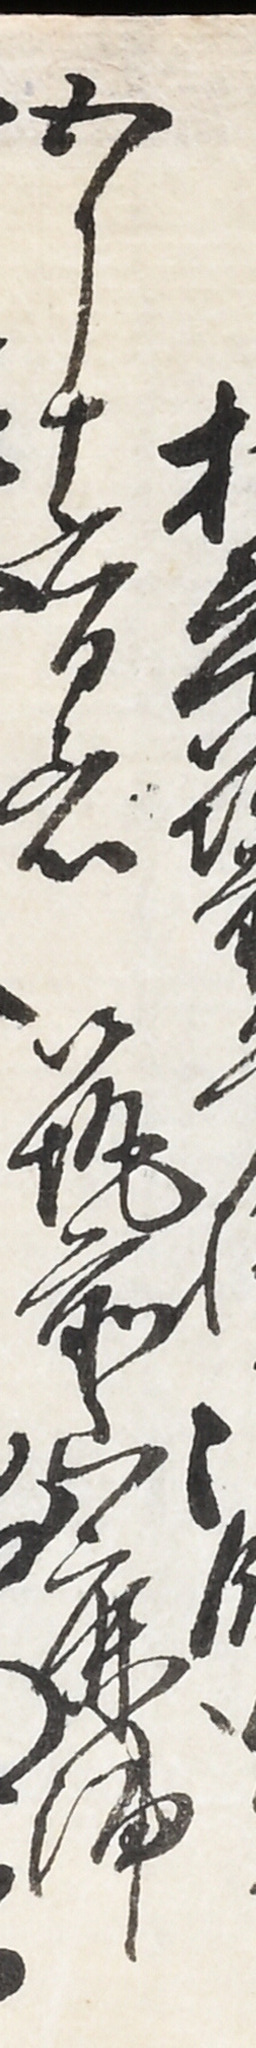五月十六日着筑前山鹿浦
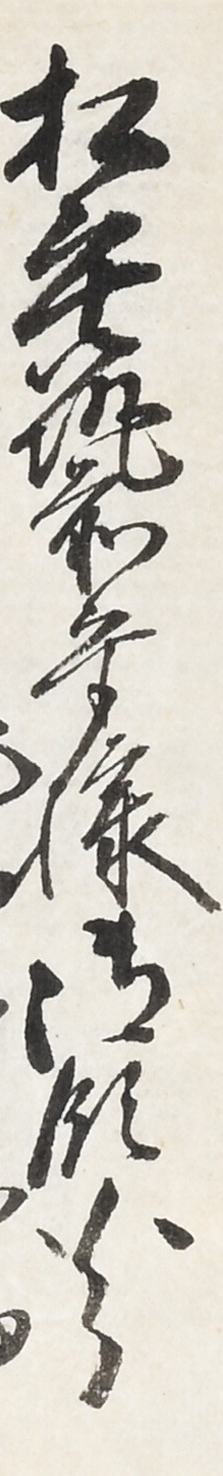松平筑前守様御領分
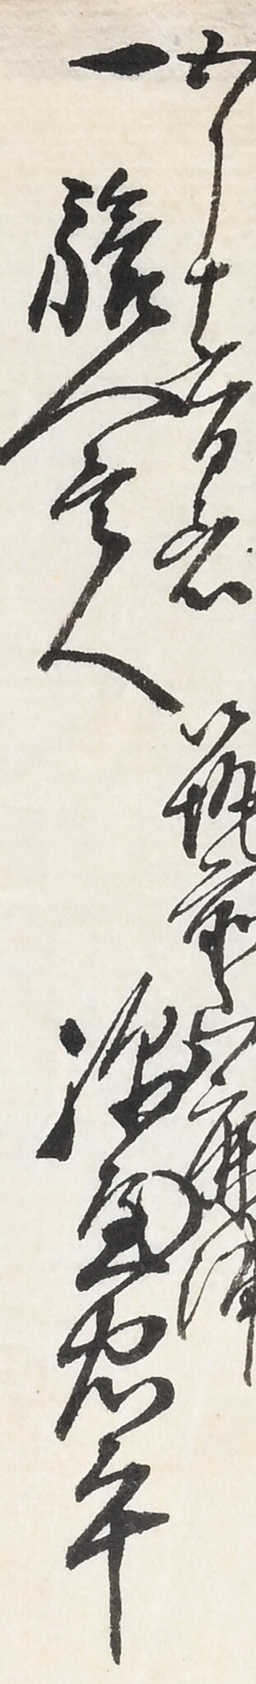一旅人壱人綿屋忠平
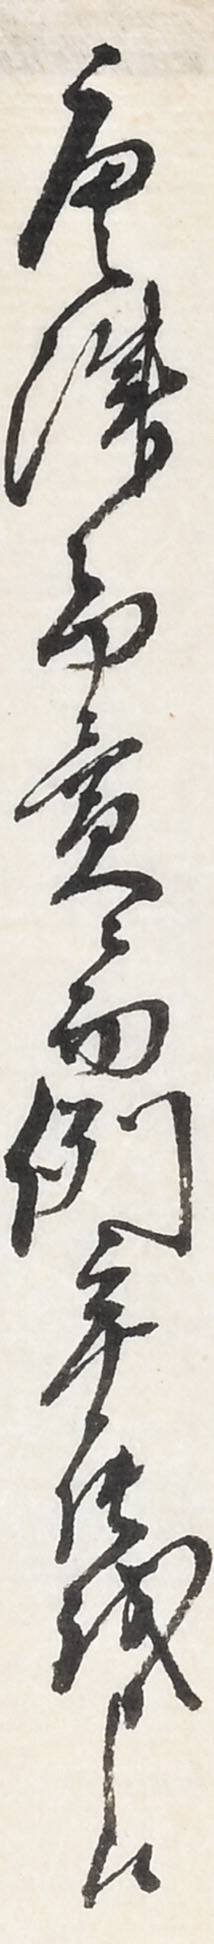唐津商売ニ而例年罷越申候
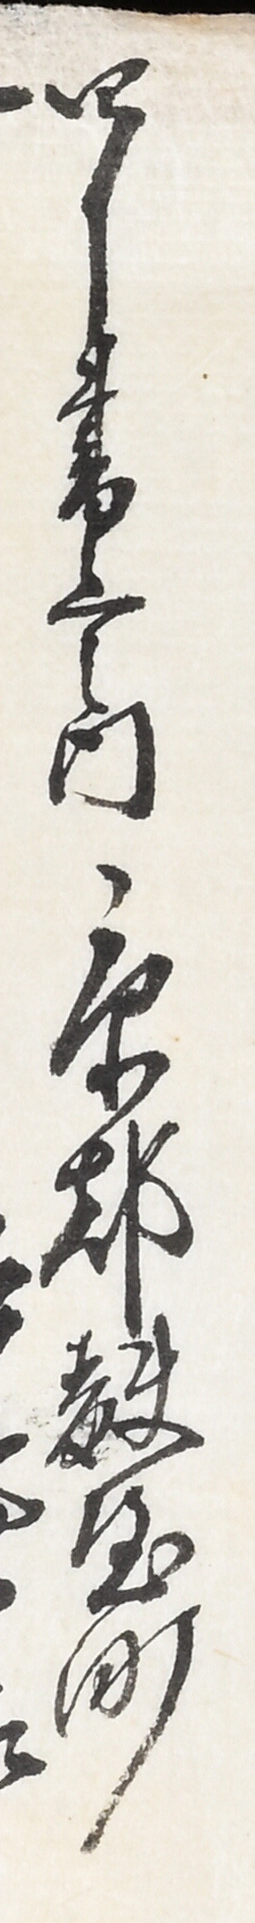四月書上之内京都麩屋町
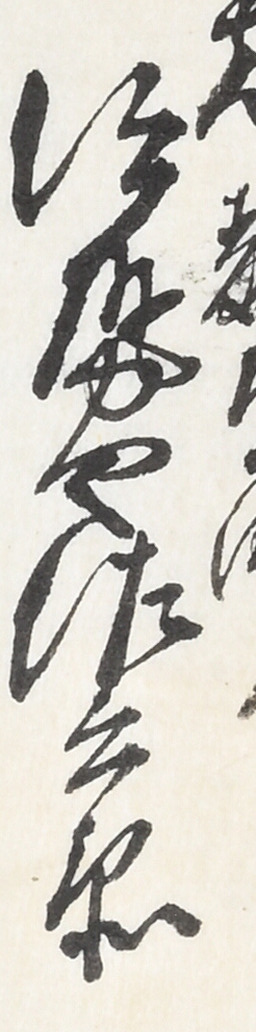一伊勢や佐兵衛
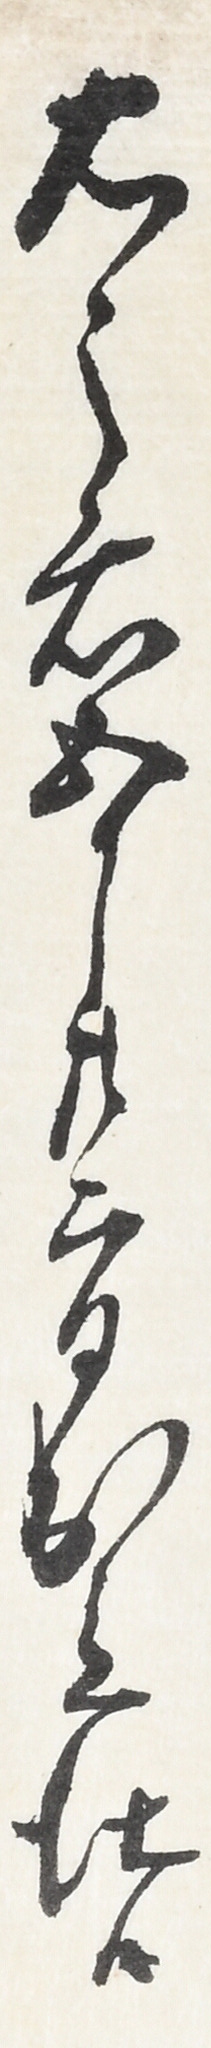右之者五月廿二日出立仕候
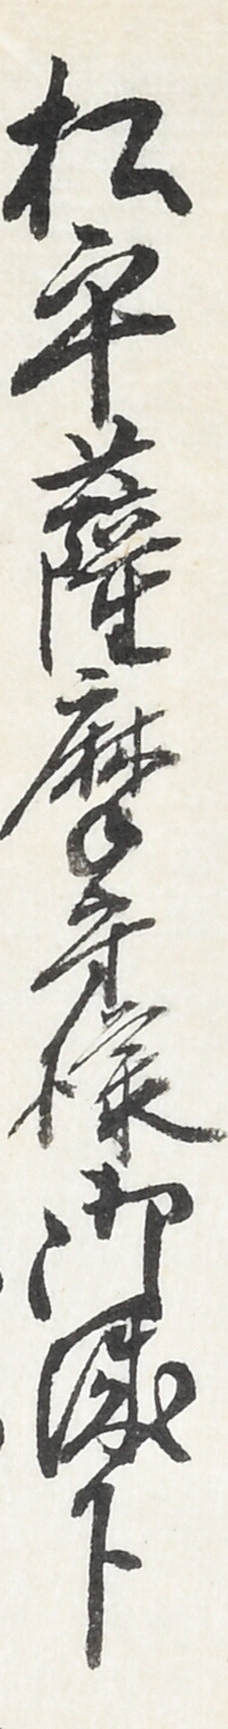松平薩摩守様御城下
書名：旅人泊控帳
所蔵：伊那市立高遠町図書館・合同会社AMANE
